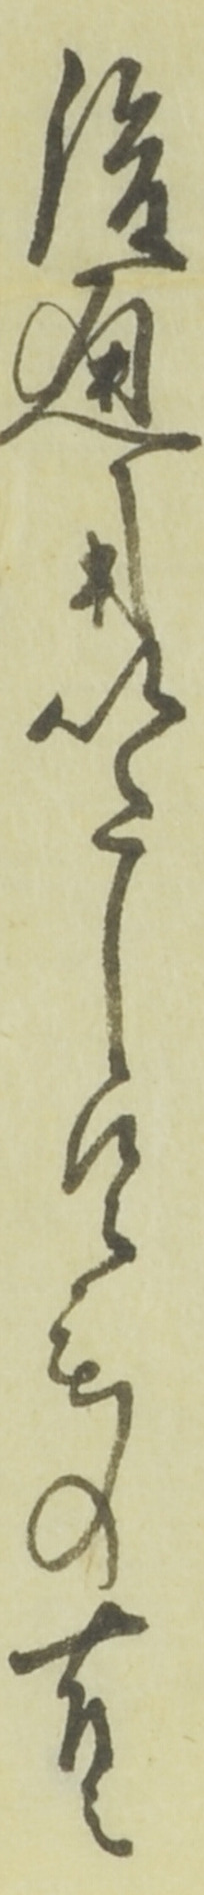後通用いたし候之もの有之
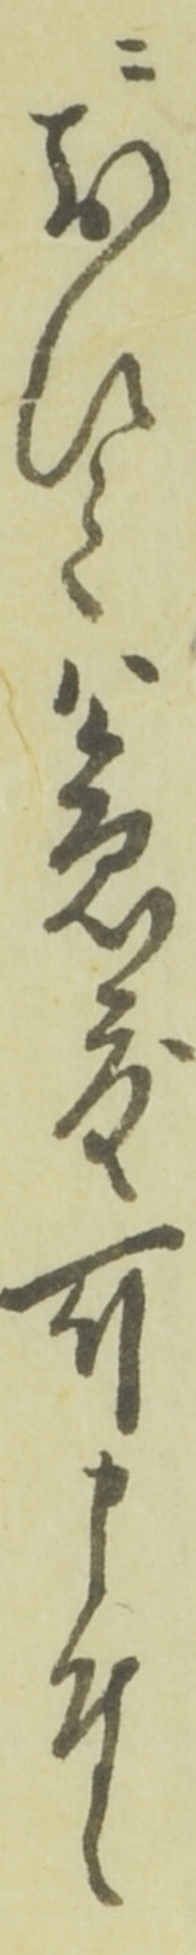ニおひてハ急度可申付候
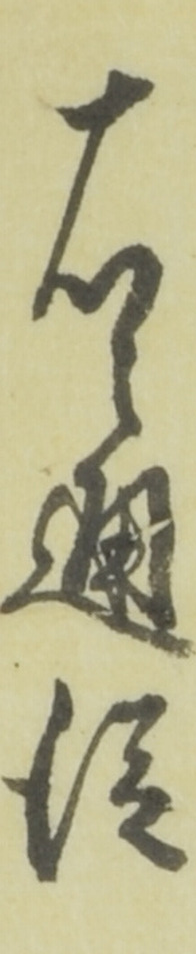右之通従
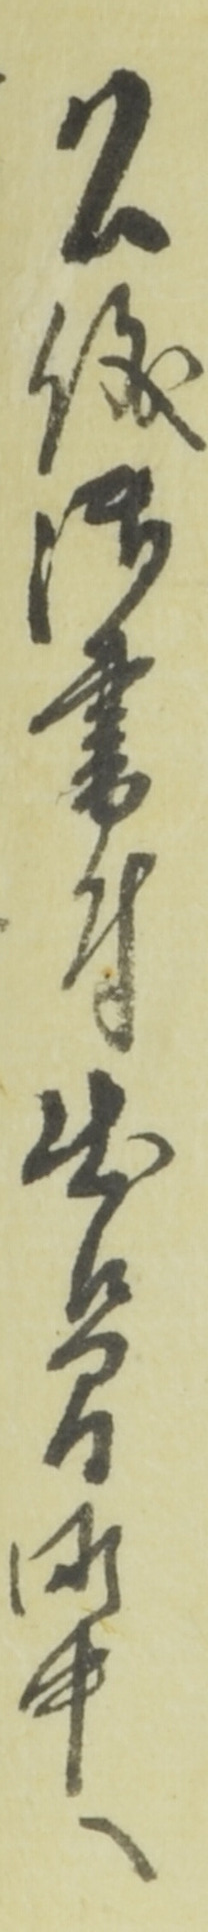公儀御書付出候間町中へ
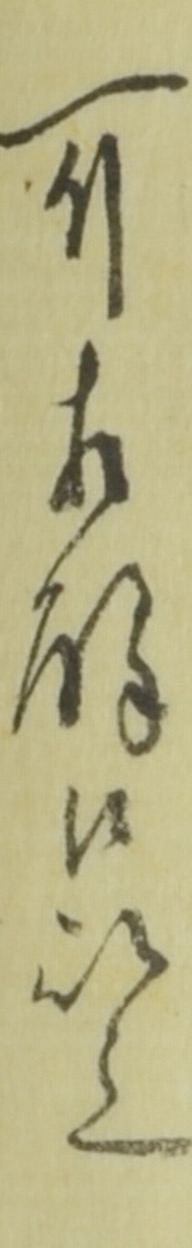可相触候以上
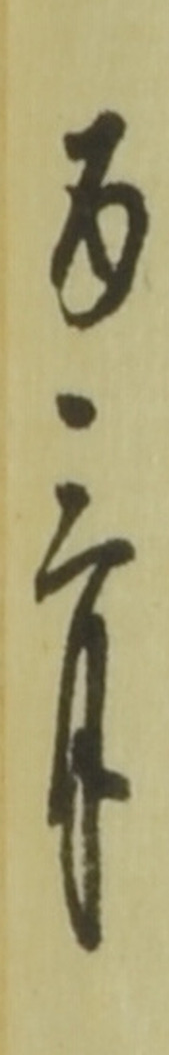酉三月
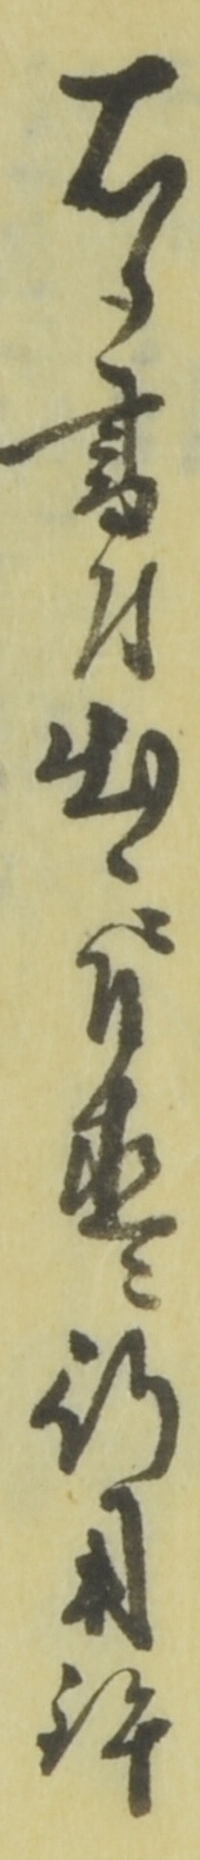右御書付出候ニ付直ニ行司鉾
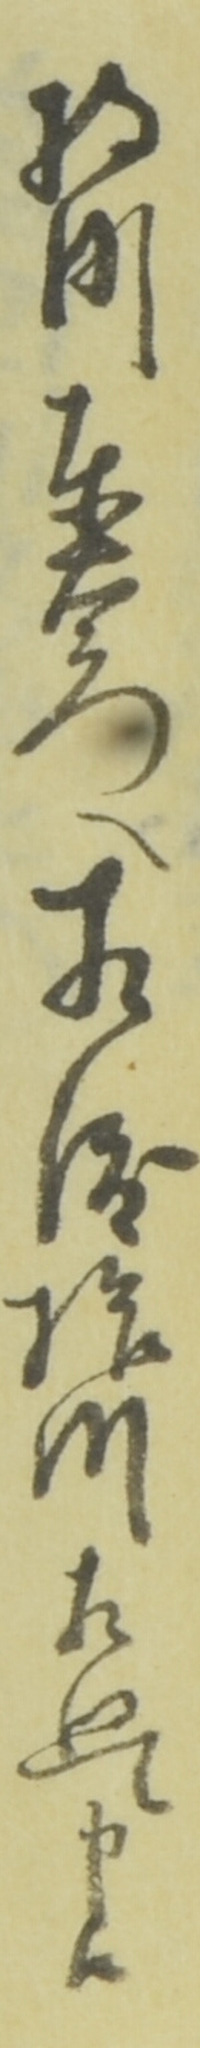持町東右衛門へ相渡拾町相廻し申候

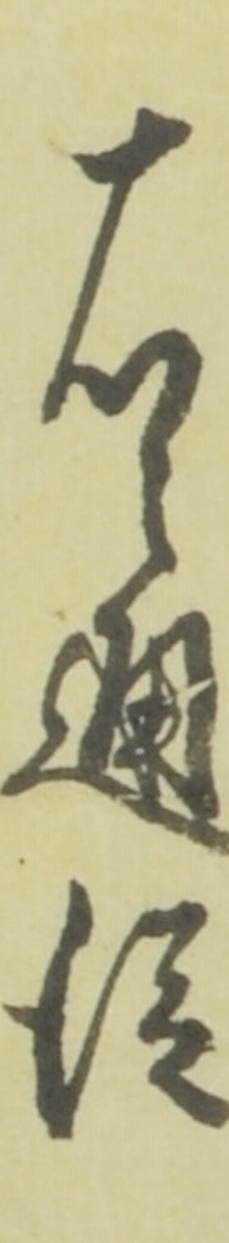右之趣従
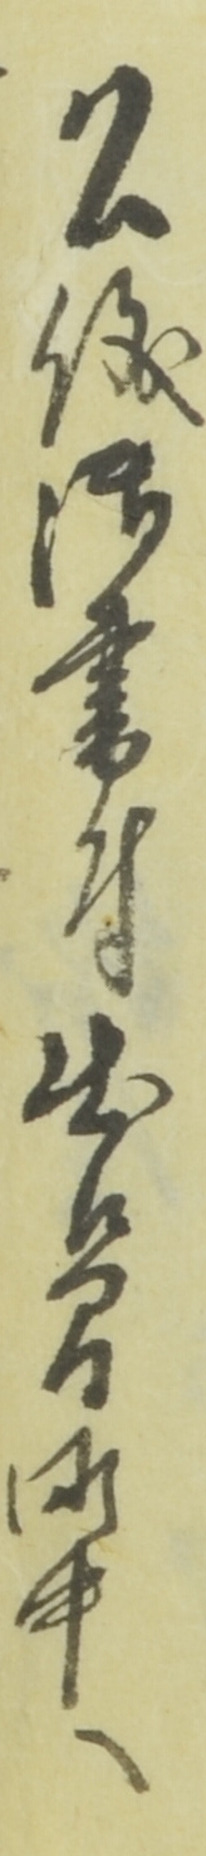公儀御書付出候間町中へ
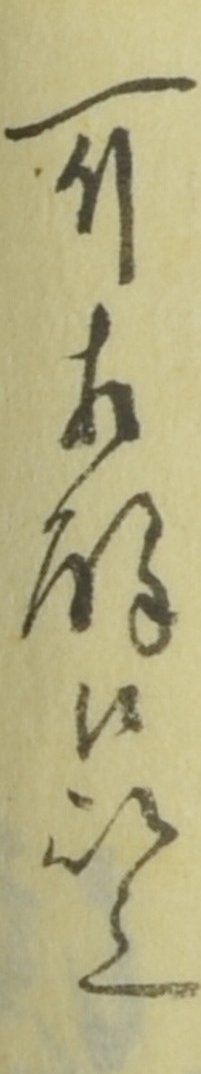可相触候以上
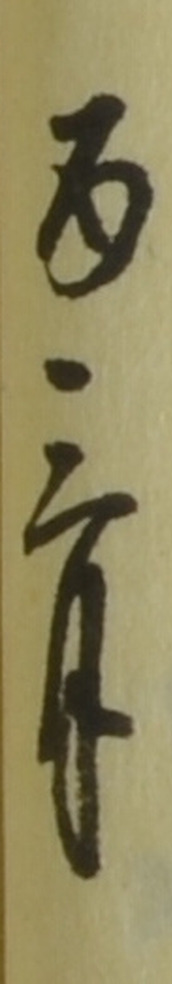酉三月
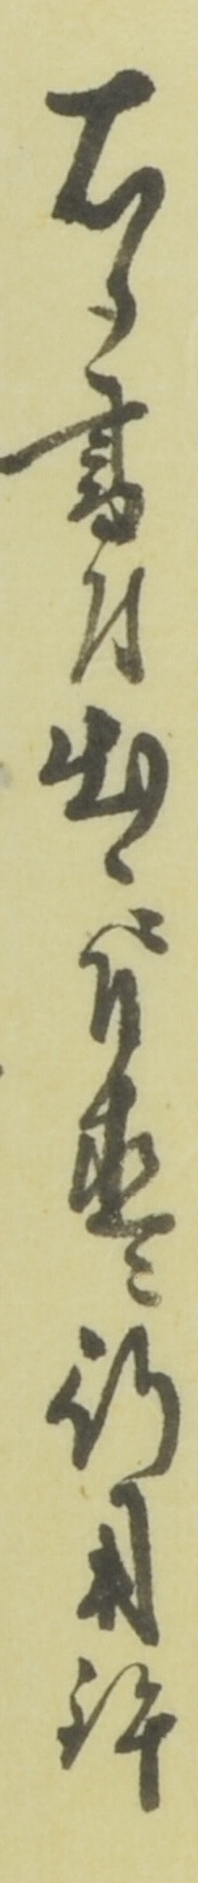右御書付出候ニ付直ニ行司鉾
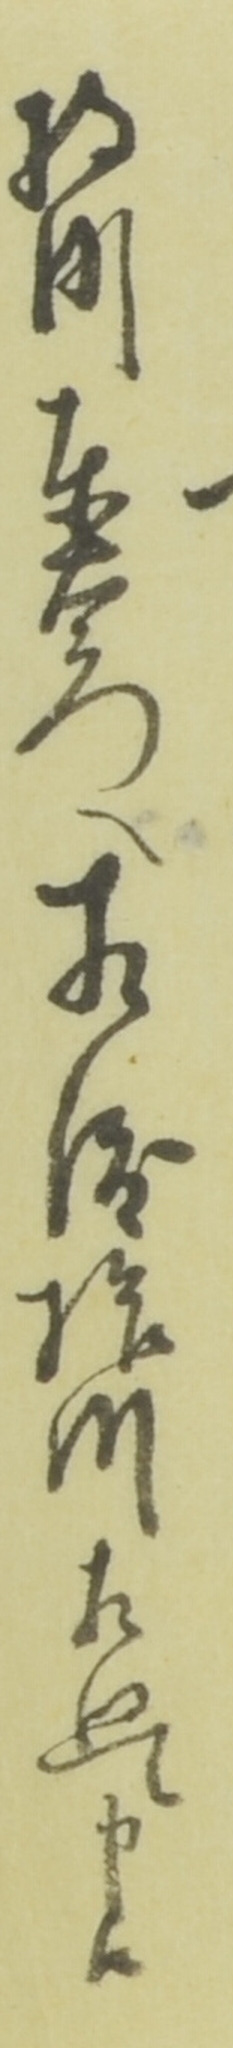持町東右衛門へ相渡拾町相廻し申候
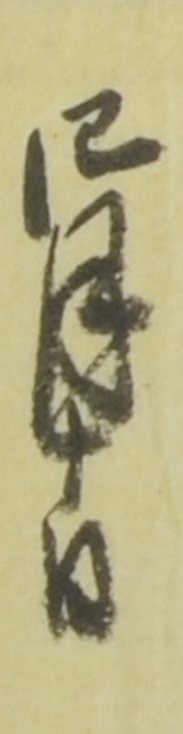四月十日
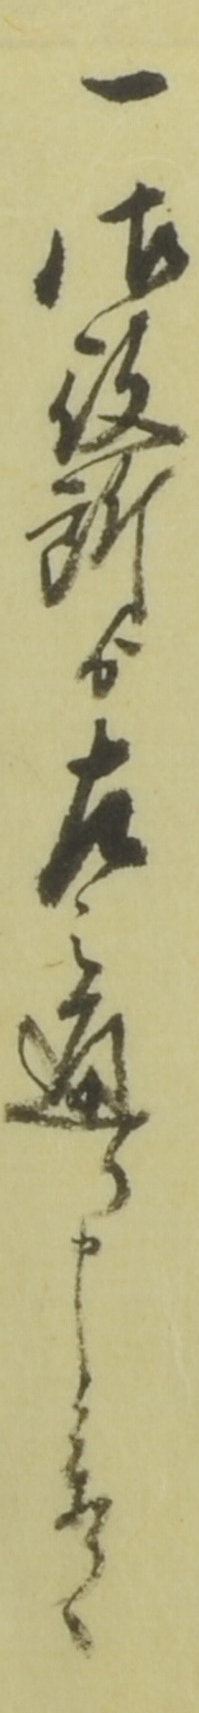一御役所ゟ左之通り申参り候
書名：御触書御書附控
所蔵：伊那市立高遠町図書館・合同会社AMANE
